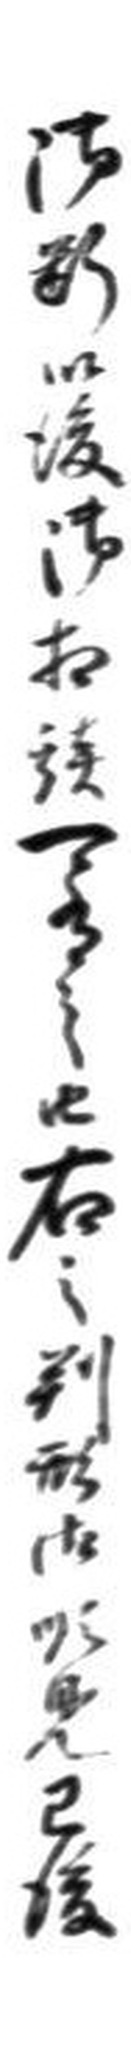御断以後御相談可有之由右之判形御順見已後
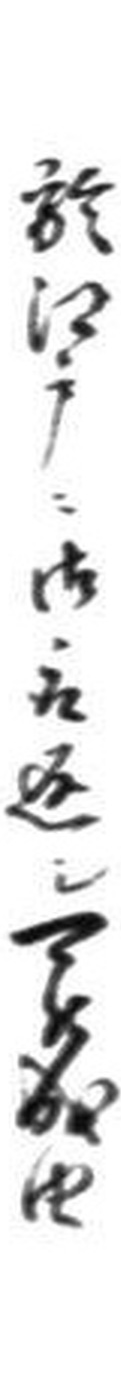於江戸ニ御取返シ可被成由
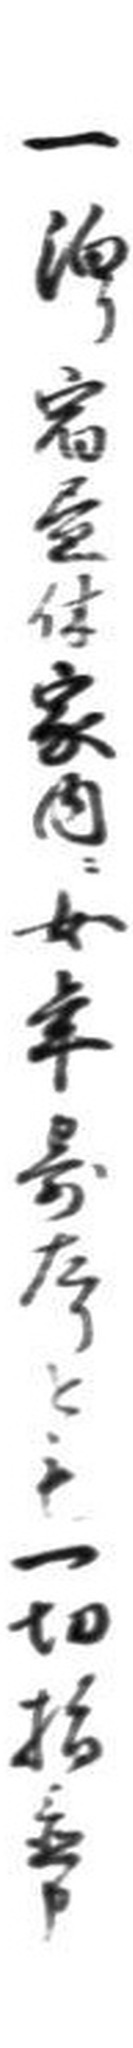一泊り宿昼休家内ニ女年寄たりとも一切指置申
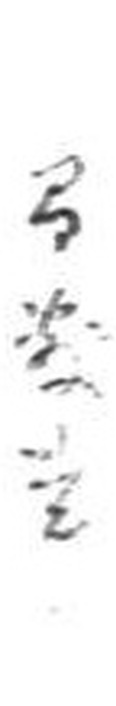間敷事
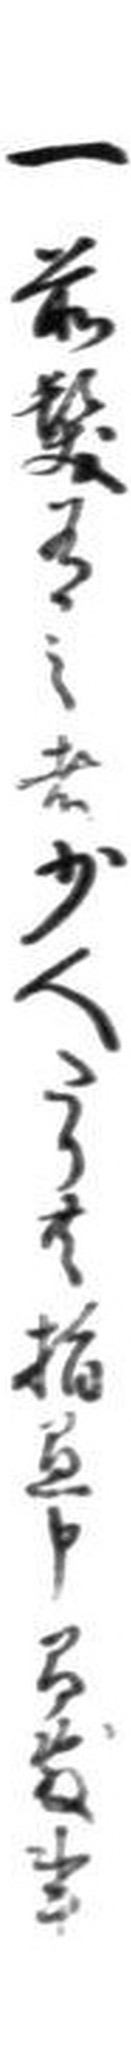一前髪有之者少人たり共指置申間敷事
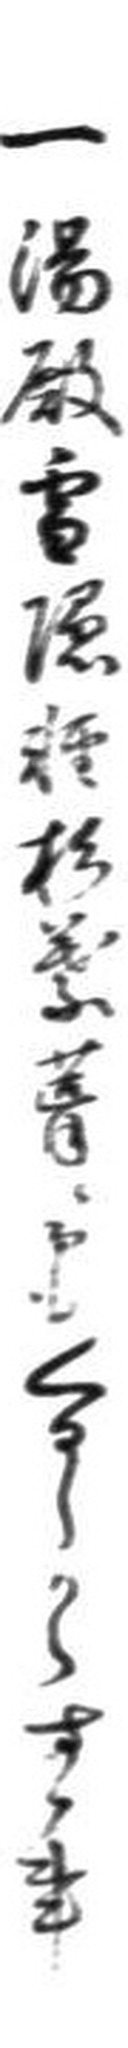一湯殿雪隠軽杉葉葺ニ而もくるしからす候事

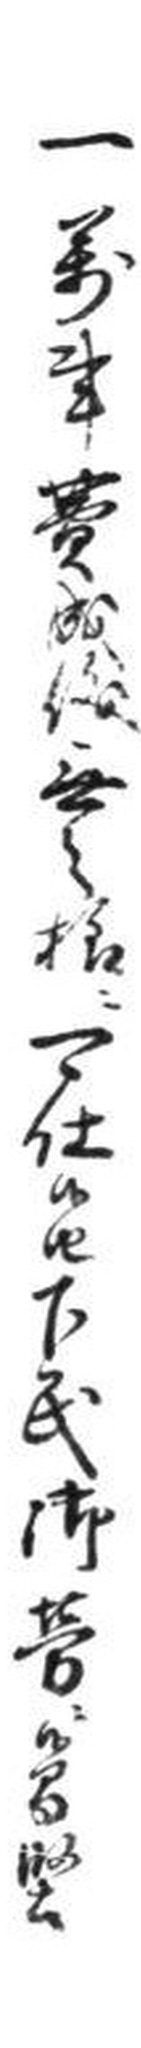一万事費成儀無之様ニ可仕候由下民御労ニ候間堅
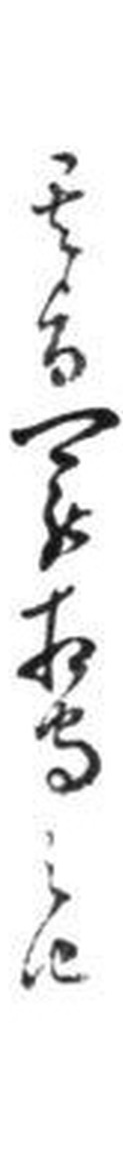其旨可被相守之由
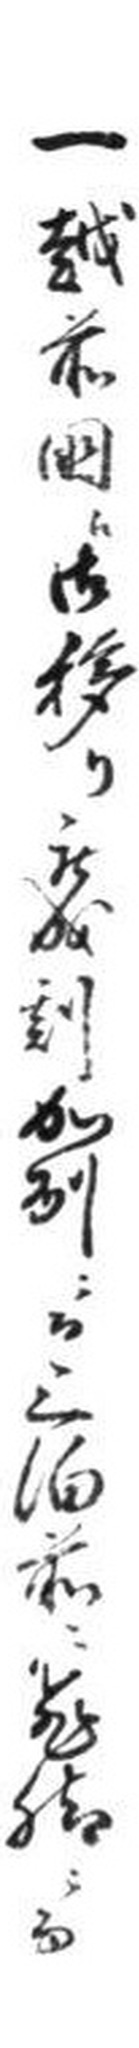一越前国江御移り被成刻加州ニ而三泊前ニ飛脚ニ而
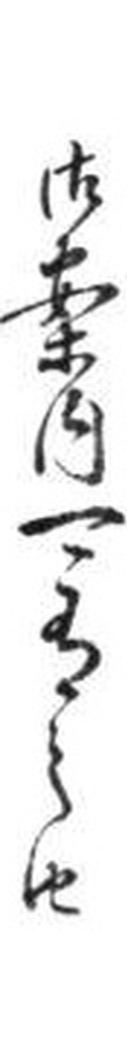御案内可有之由
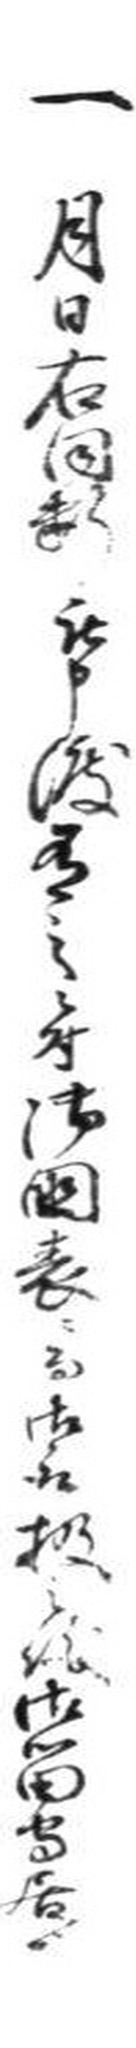一月日右同断被申渡有之ニ付御国表ニ而御取扱之儀御留守居ゟ
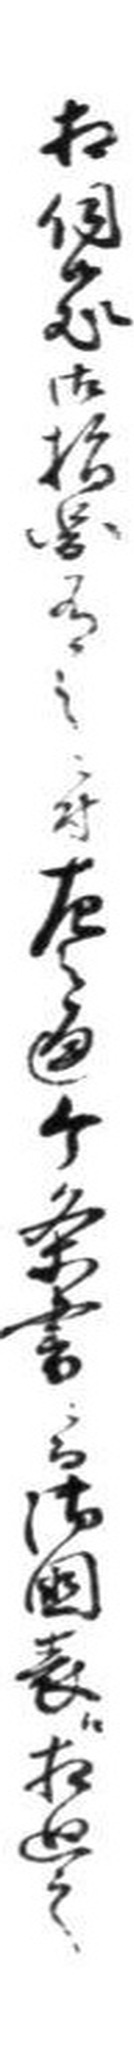相伺候処御指図有之ニ付左之通ヶ条書ニ而御国表江相廻之
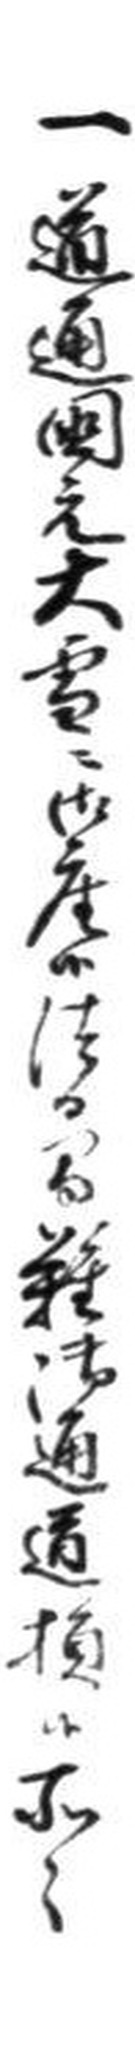一道通国元大雪ニ御座候つる間難御通道損候所々
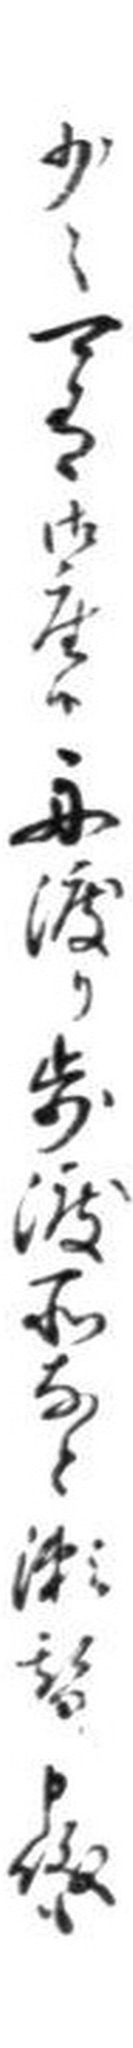少々可有御座候舟渡り歩渡所なと瀬替申儀も
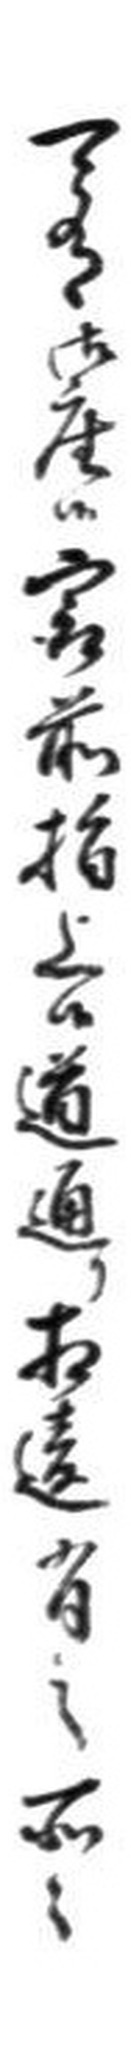可有御座候最前指上候道通り相違有之処々
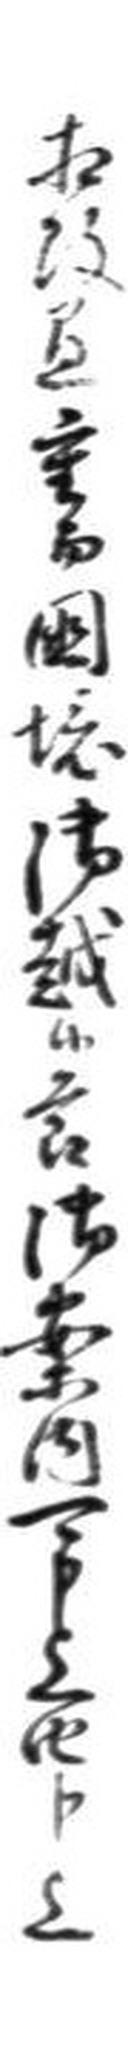相改置重而国境御越候節御案内可申上由申上
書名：家譜 十五 綱昌公 従天和元年到元禄十二年
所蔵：福井県文書館 Fukui Prefectural Archives
